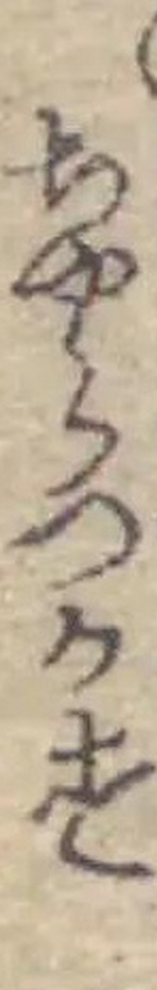ちやらつかす
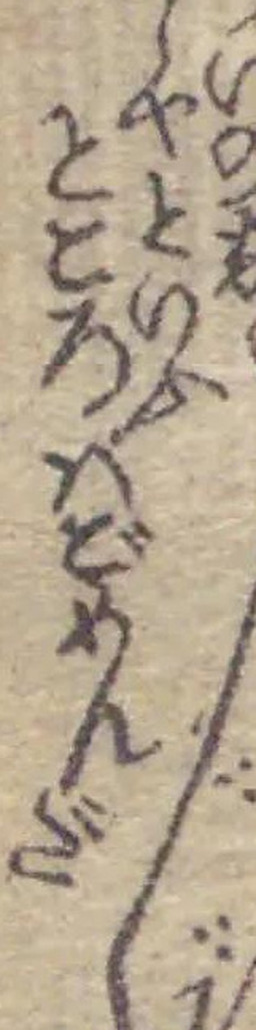ところはごめんだ
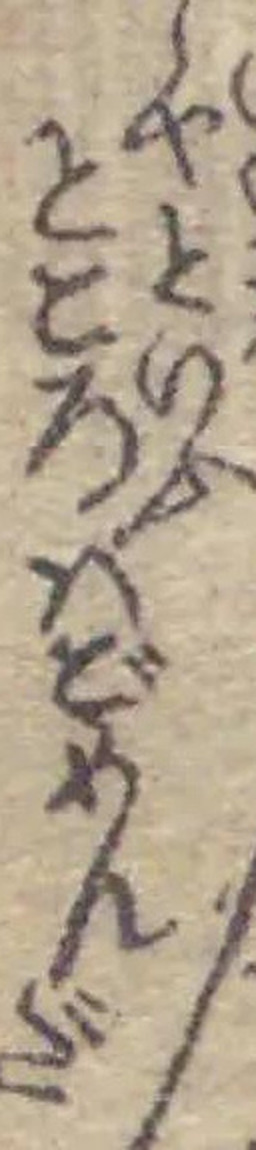ところはごめんだ

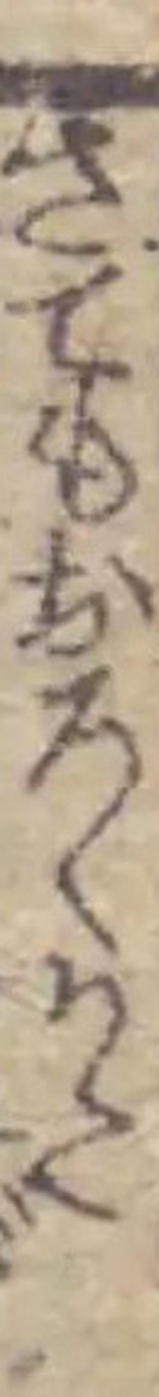さてもおろくかた
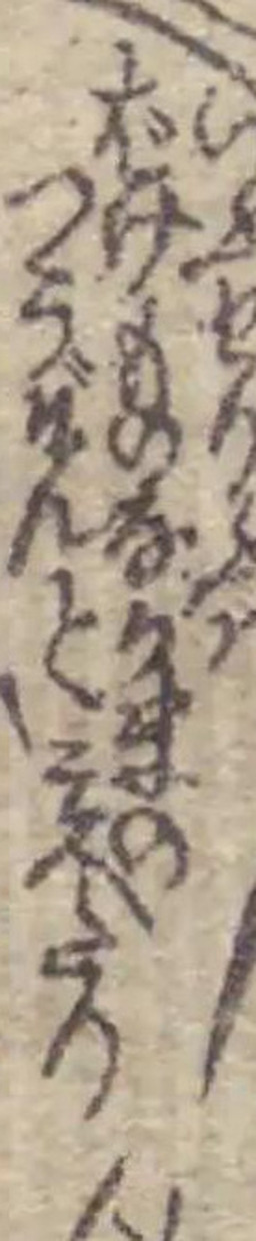ばけものなかまの
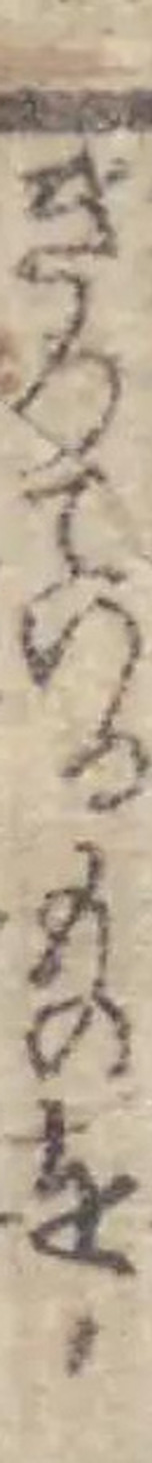きつているものを
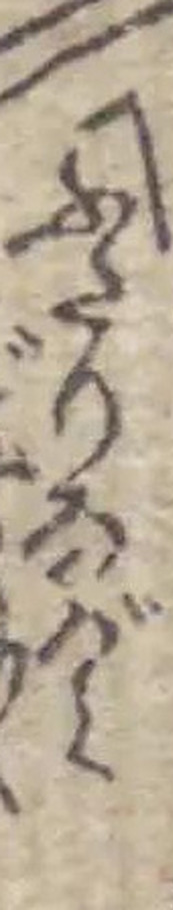〽ふたりながら
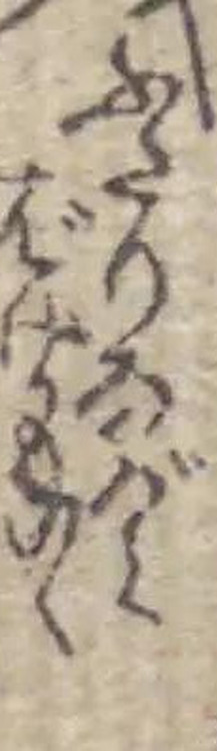〽ふたりながら
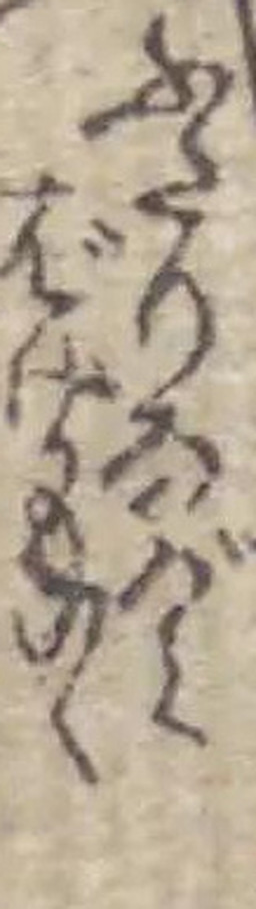ばけものゝ
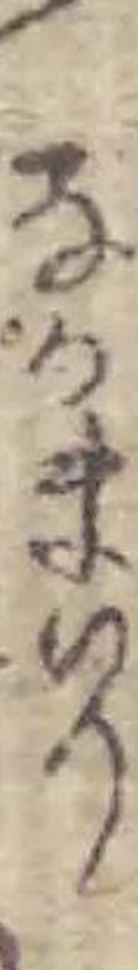なかまいり
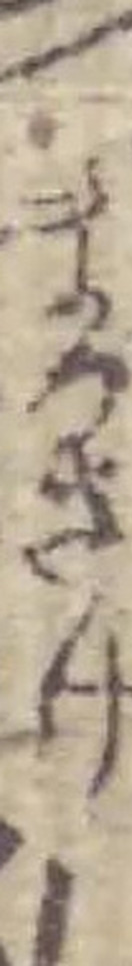まづさけ
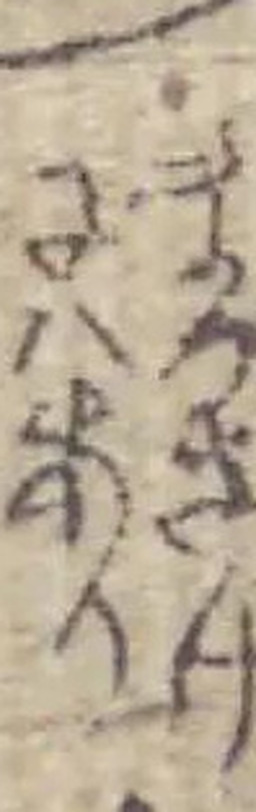にはあり
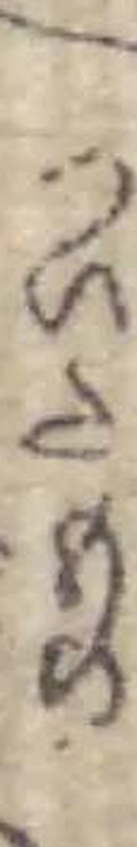ついたもの
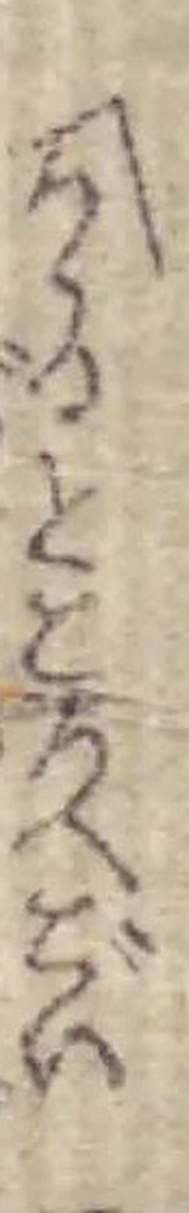〽かゝるところへごい
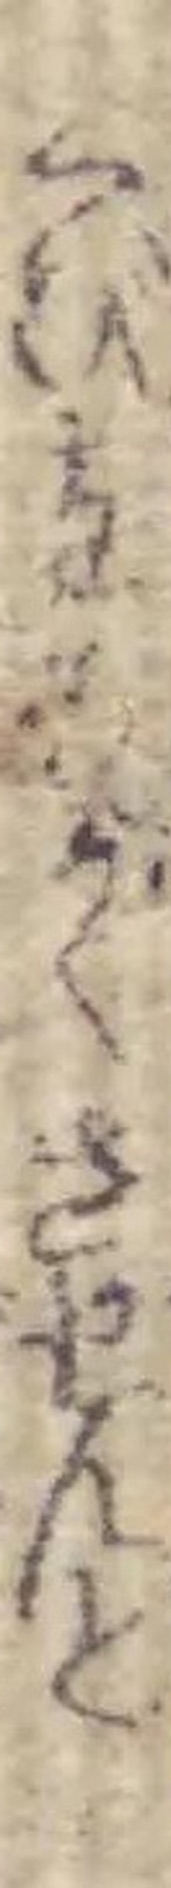くびをながくさせんと
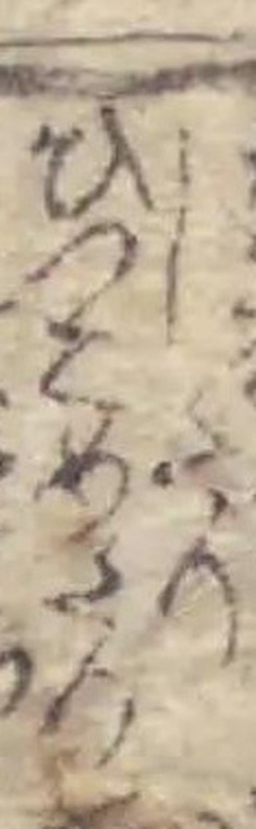ひつこめたり
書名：化物尽 4巻
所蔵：国立国会図書館 National Diet Library, JAPAN
